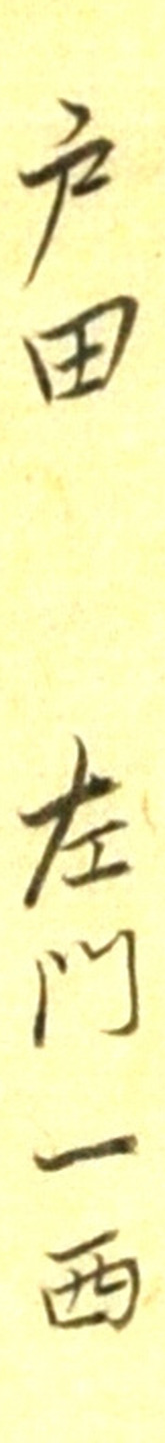戸田左門一西
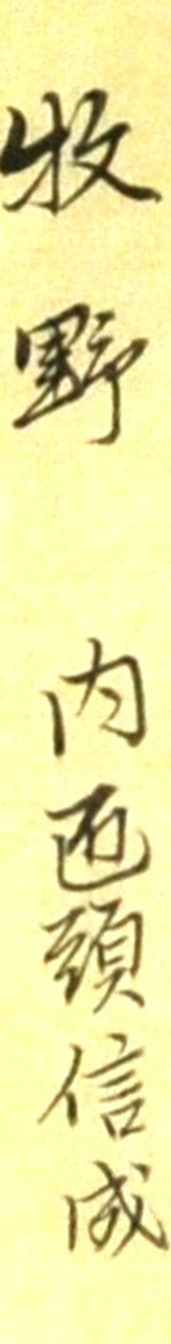牧野内匠頭信成

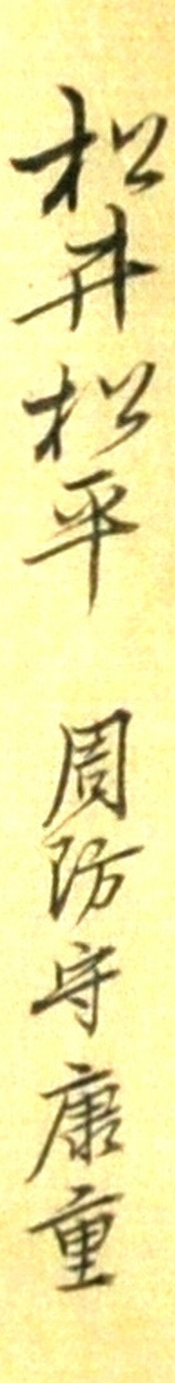松井松平周防守康重
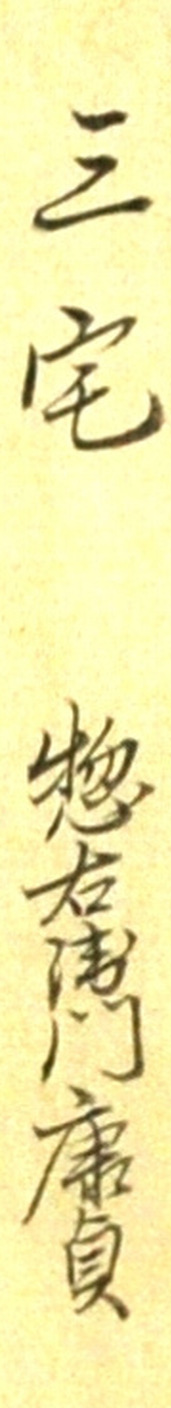三宅惣右衛門康貞
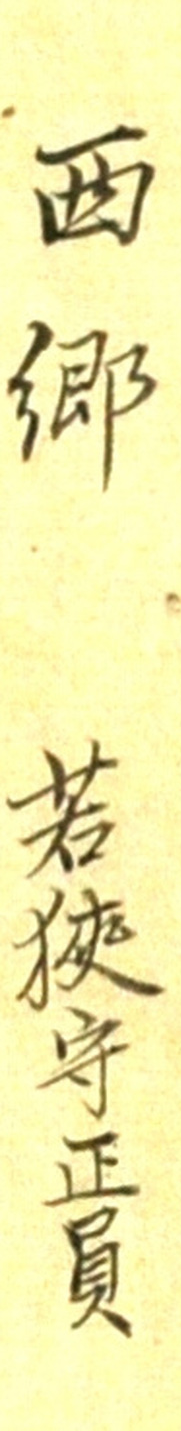西郷若狭守正印員
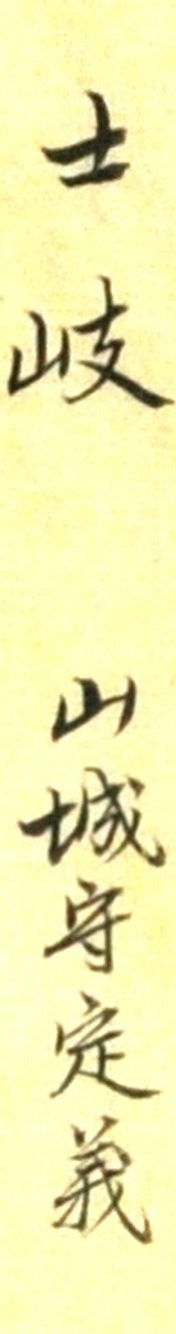土岐山城守定義
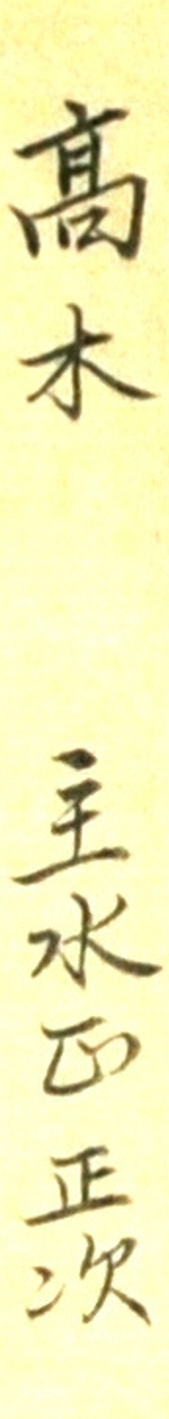高木主水正正次
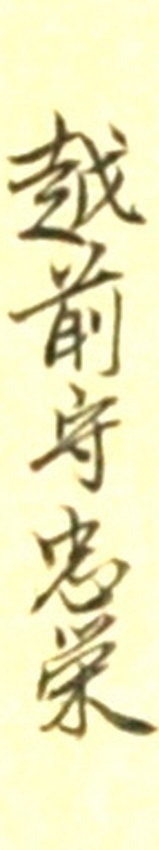越前守忠栄
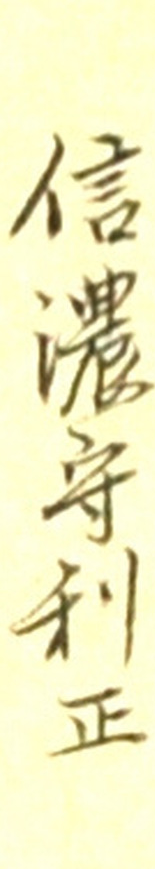信濃守利正
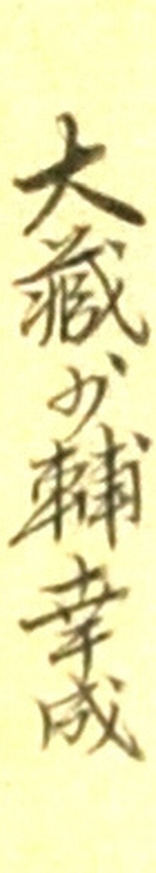大蔵少輔幸成

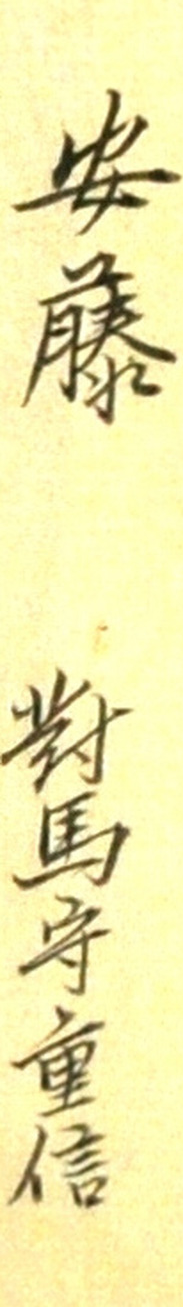安藤対馬守重信
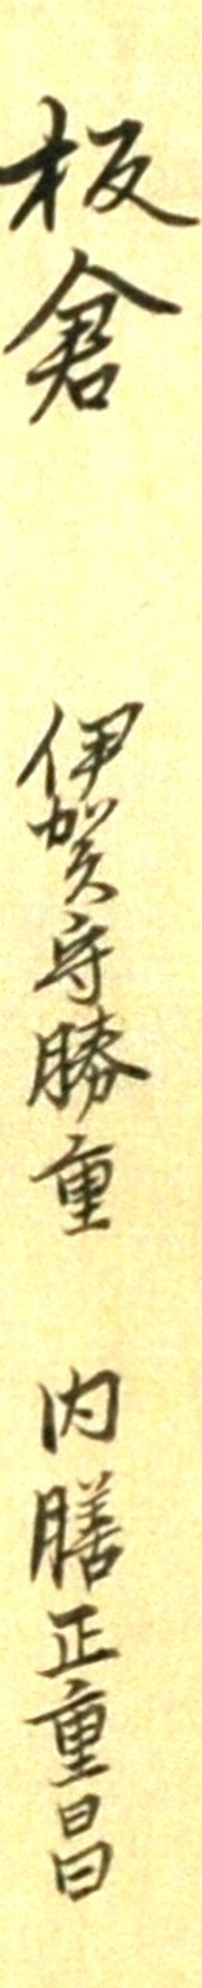板倉伊賀守勝重内膳正重昌
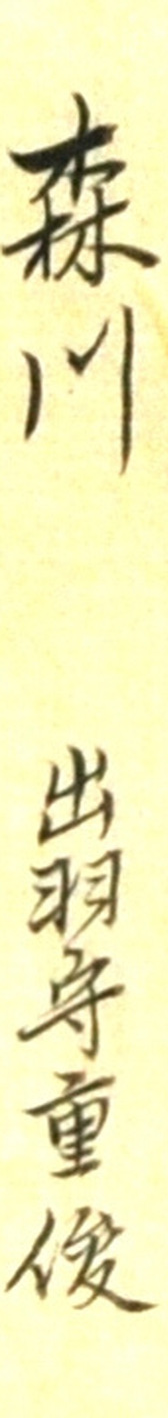森川出羽守重俊
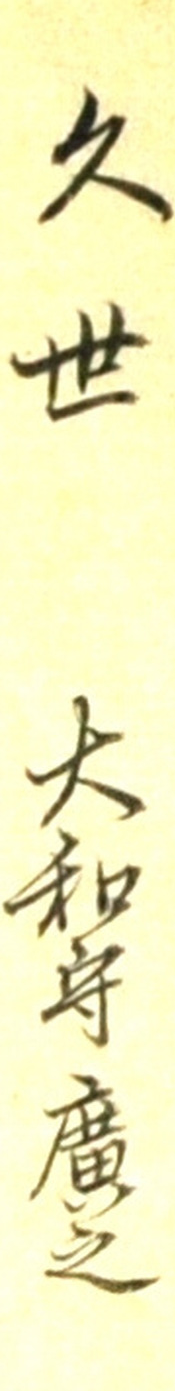久世大和守広之
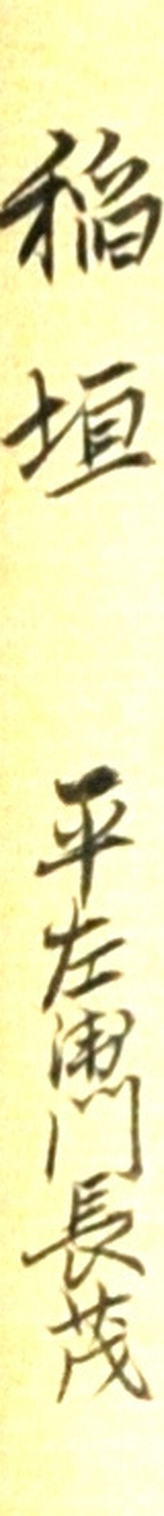稲垣平左衛門長茂
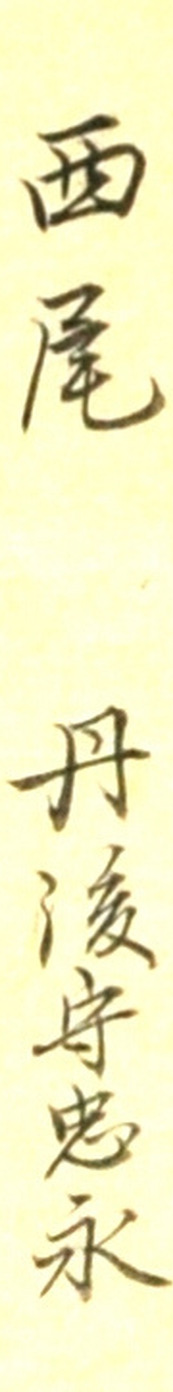西尾丹後守忠永
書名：藩翰譜（一）
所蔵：伊那市立高遠町図書館・合同会社AMANE
